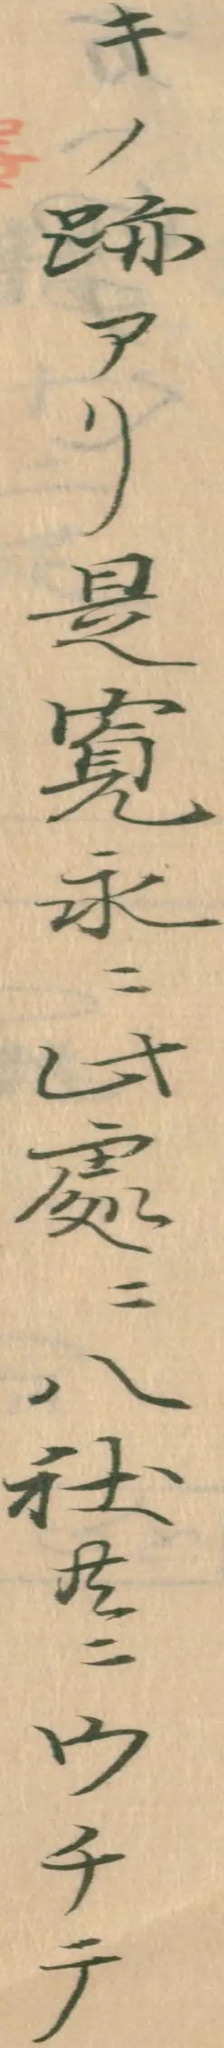キノ跡アリ是寛永ニ此処ニ八社共ニウチテ
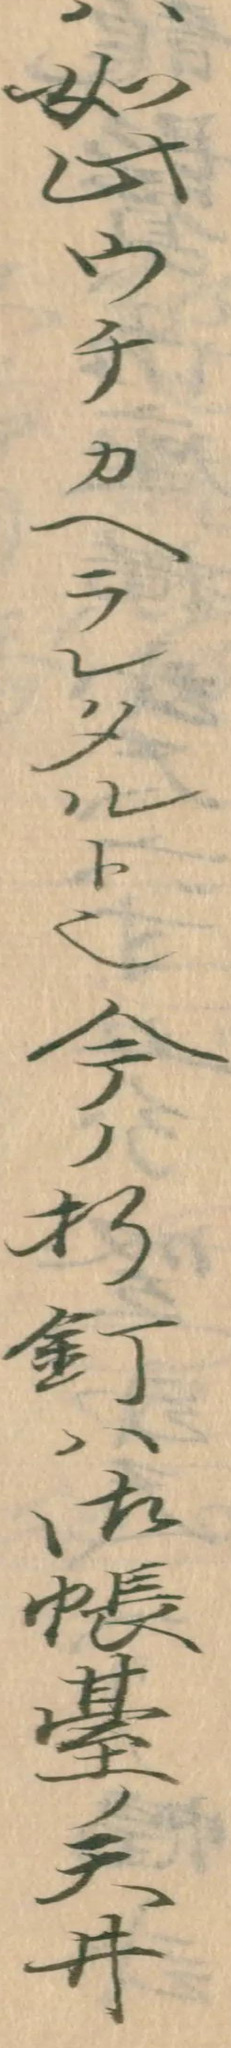ハ如此ウチカヘラレタルト也今ノ折釘ハ御帳台ノ天井
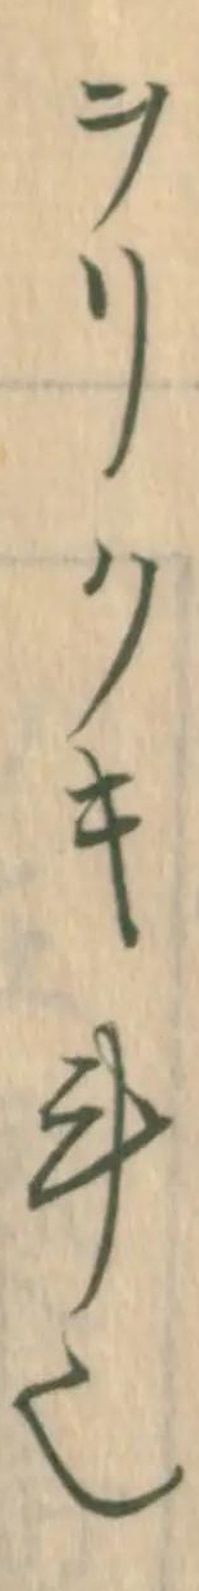ヲリクキ計也
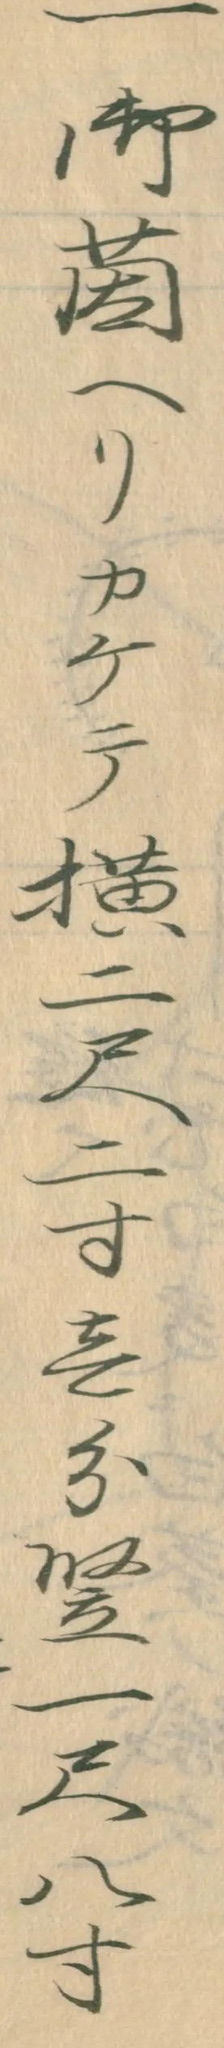一御茵ヘリカケテ横二尺二寸壱分竪一尺八寸
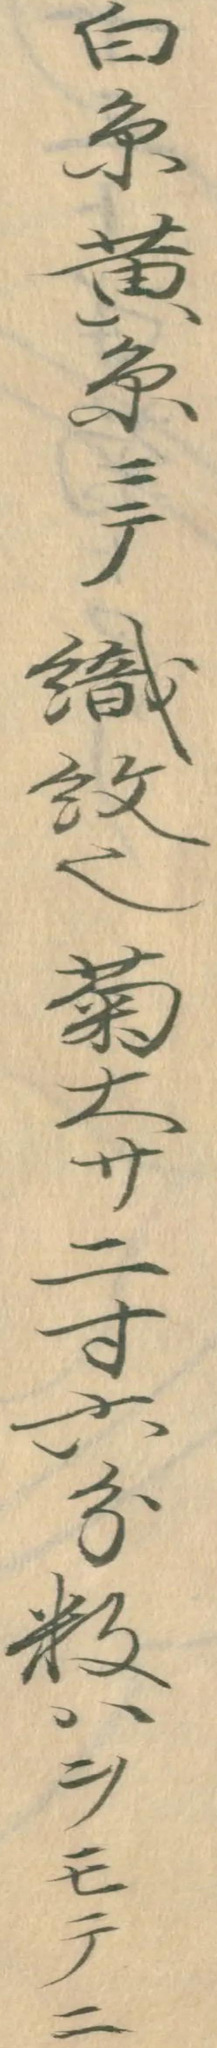白糸黄糸ニテ織紋也菊大サ二寸六分数ハヲモテ二

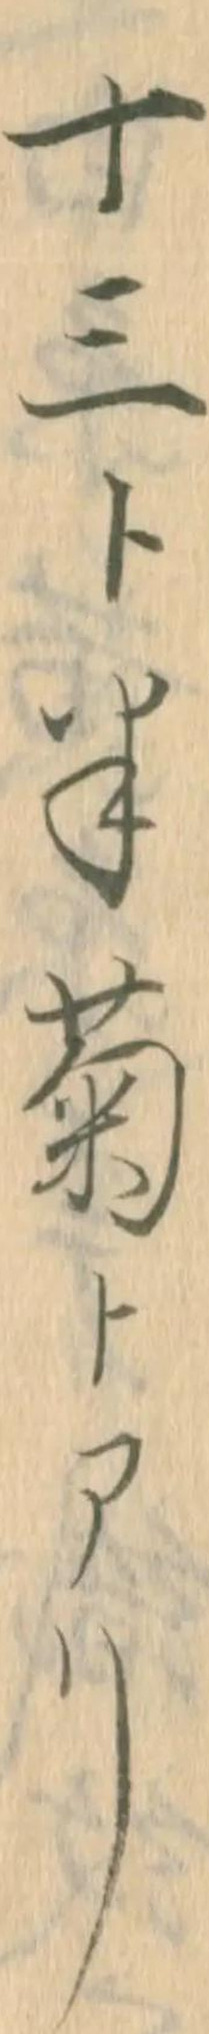十三ト半菊トアリ
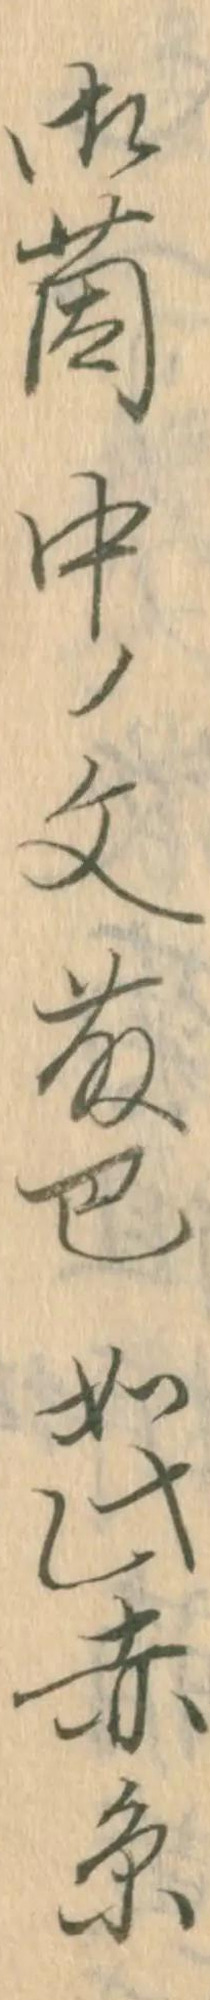御茵中ノ文藤巴如此赤糸
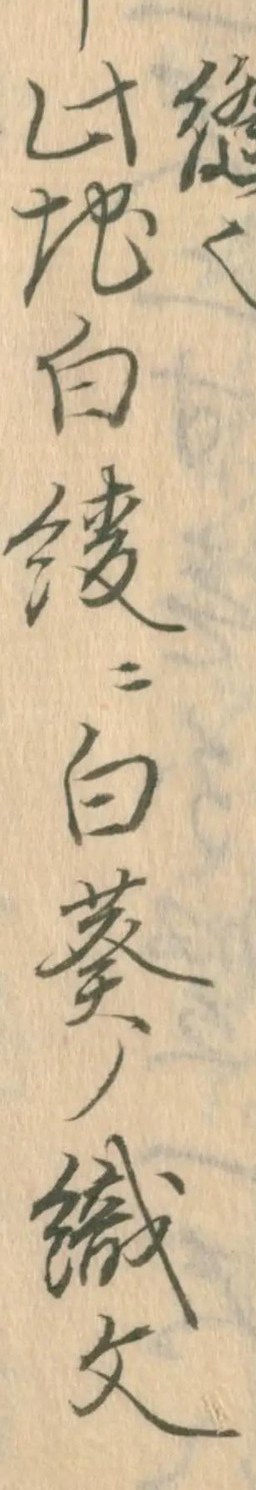此地白綾ニ白葵ノ織文
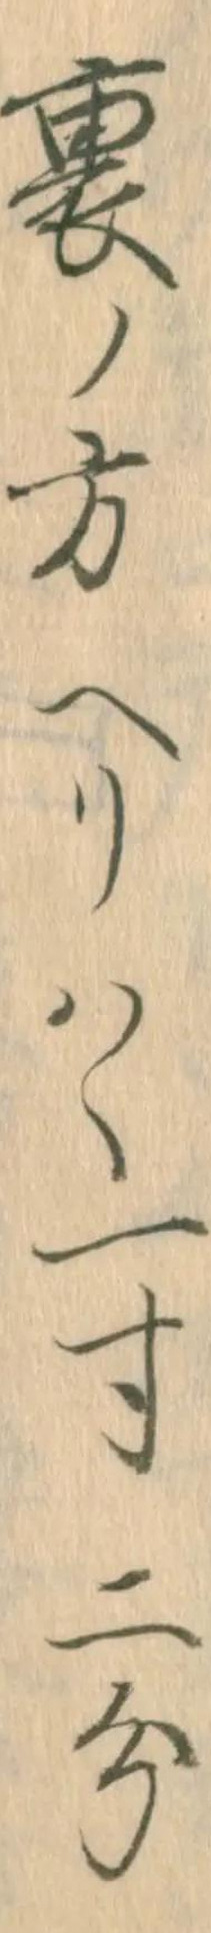裏ノ方へリハヽ一寸二分
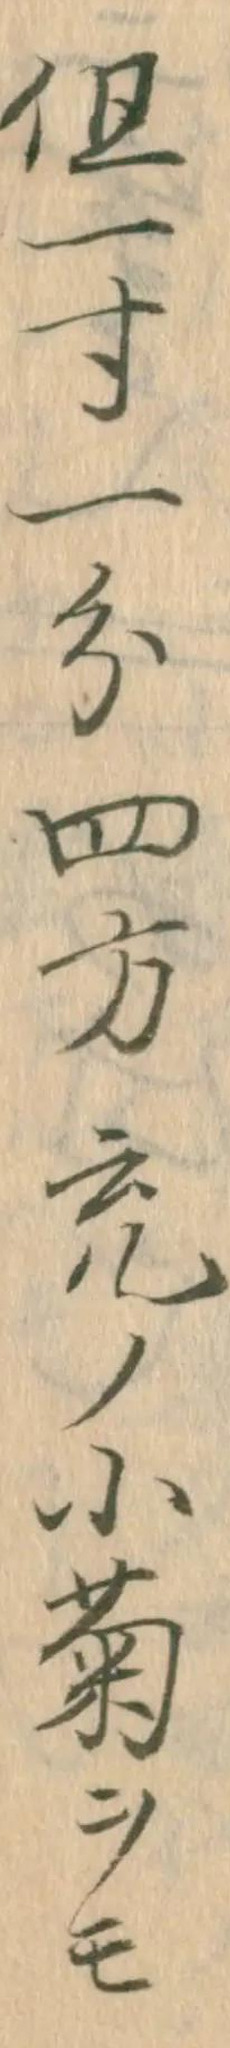但一寸一分四方充ノ小菊ヲモ
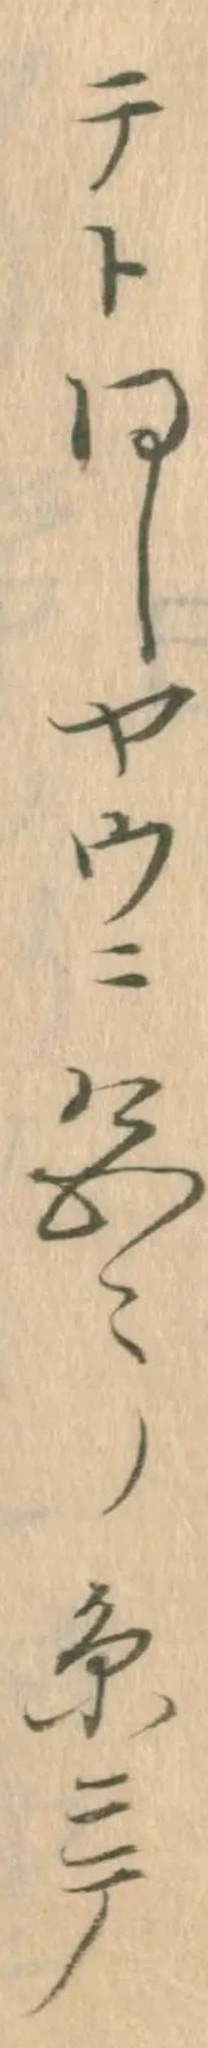テト同しヤウニ色々ノ糸ニテ
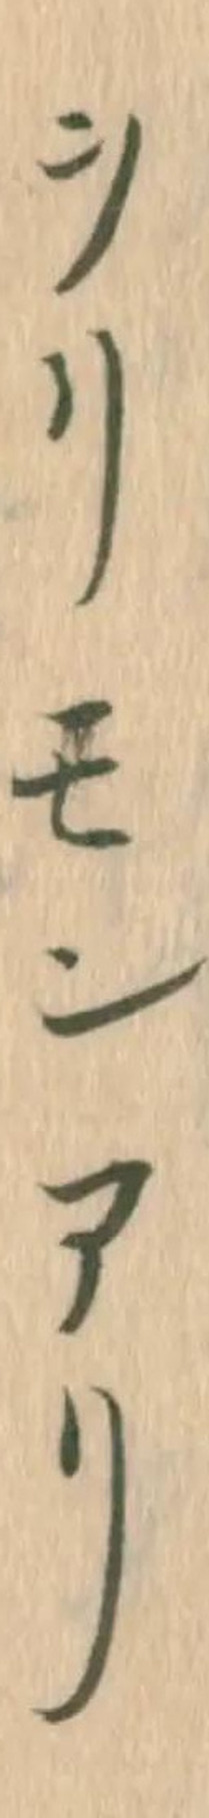ヲリモンアリ
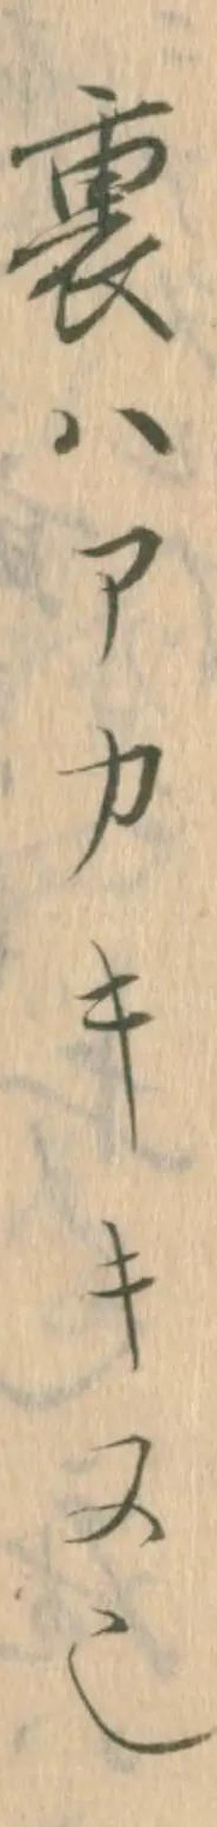裏ハアカキキヌ也
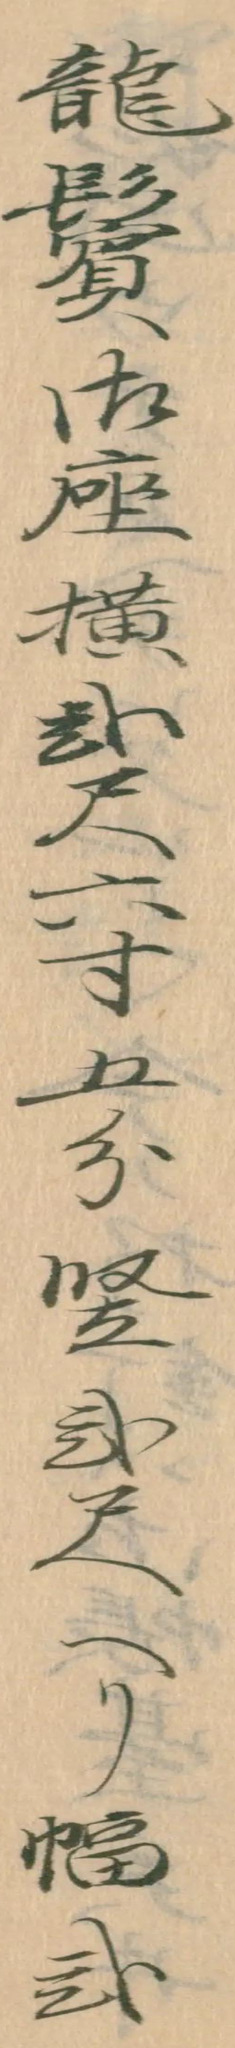一龍鬢御座横弐尺六寸五分竪弐尺ヘリ幅弐
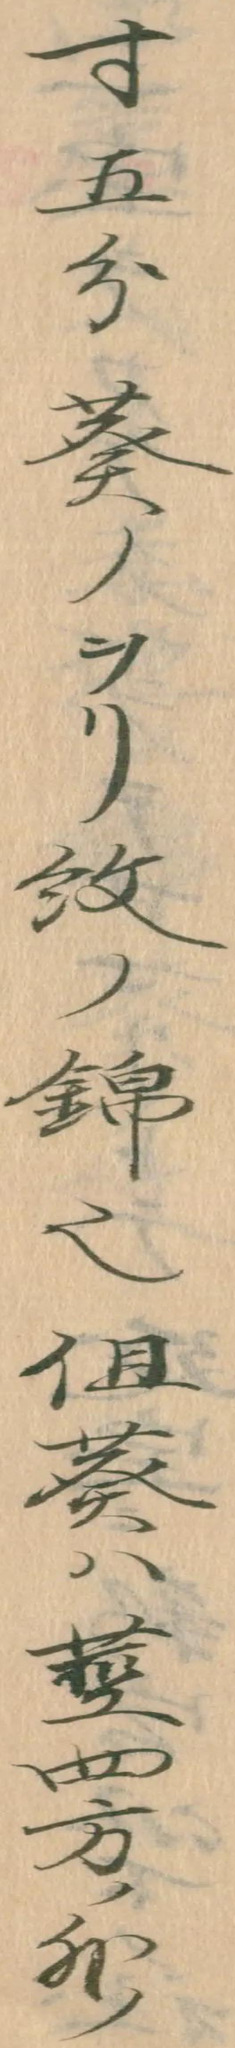寸五分葵ノヲリ紋ノ錦也但葵ハ茎四方ノ外ノ
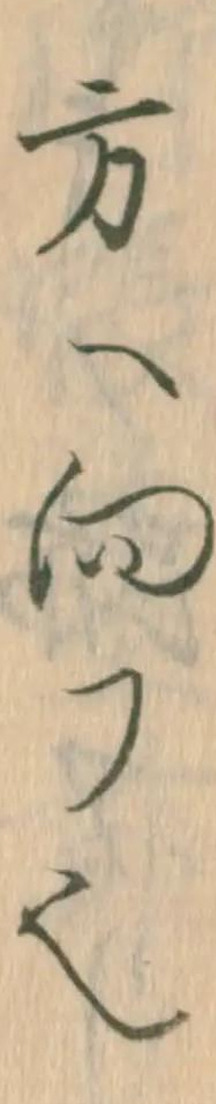方ヘ向フ也
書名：賀茂社記録. 第15冊
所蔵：国立国会図書館 National Diet Library, JAPAN
